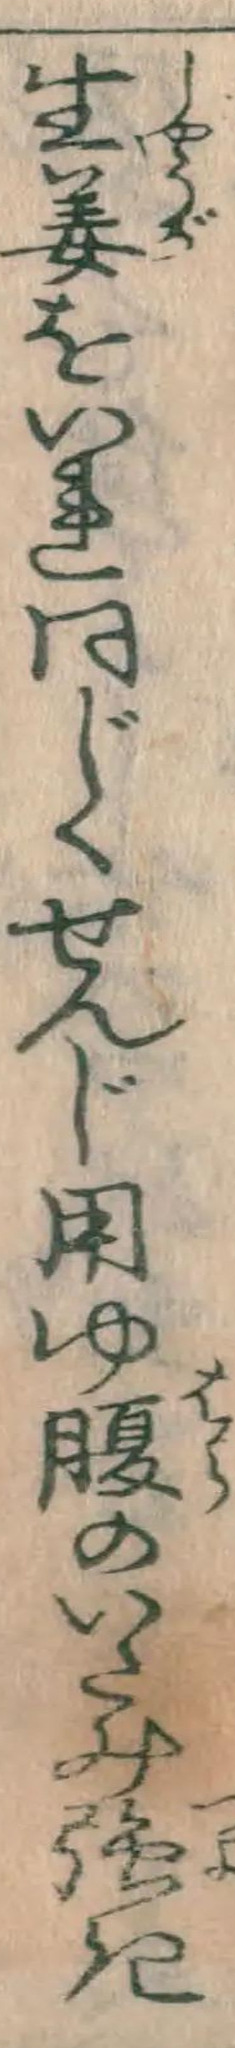生姜をいれ同じくせんじ用ゆ腹のいたみ強き
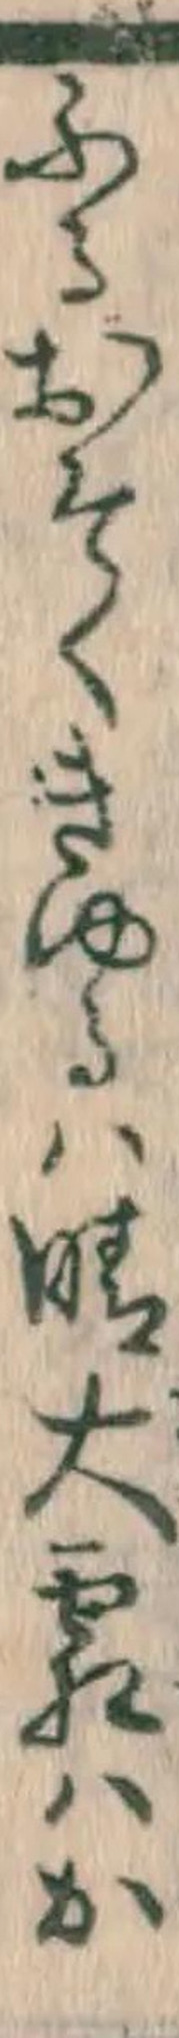ふるおそくきゆるは晴大霜はか
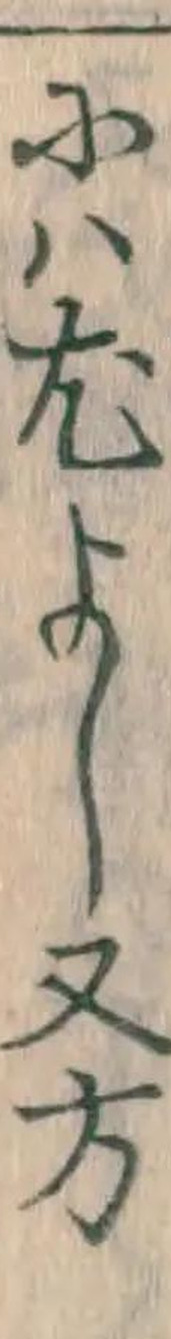には尤よし又方
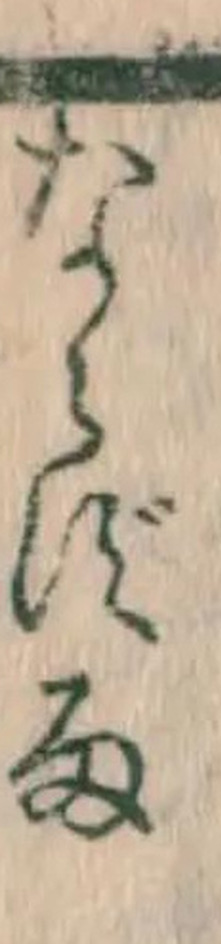ならず雨
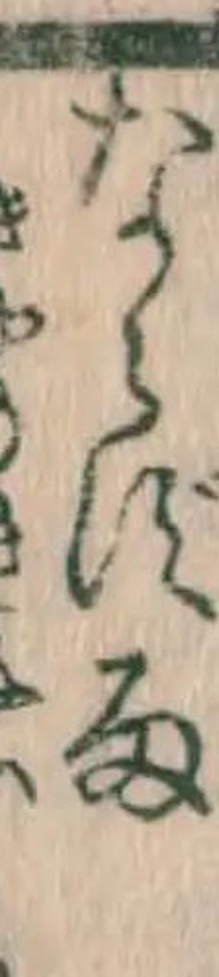ならず雨
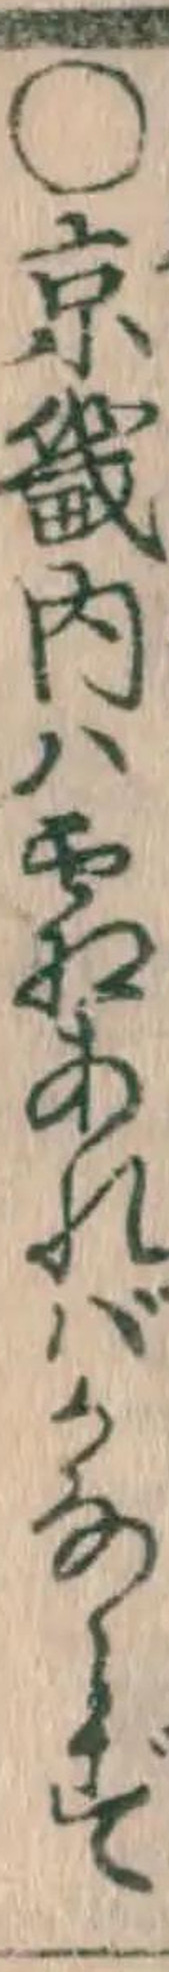○京畿内は霜あればかならず
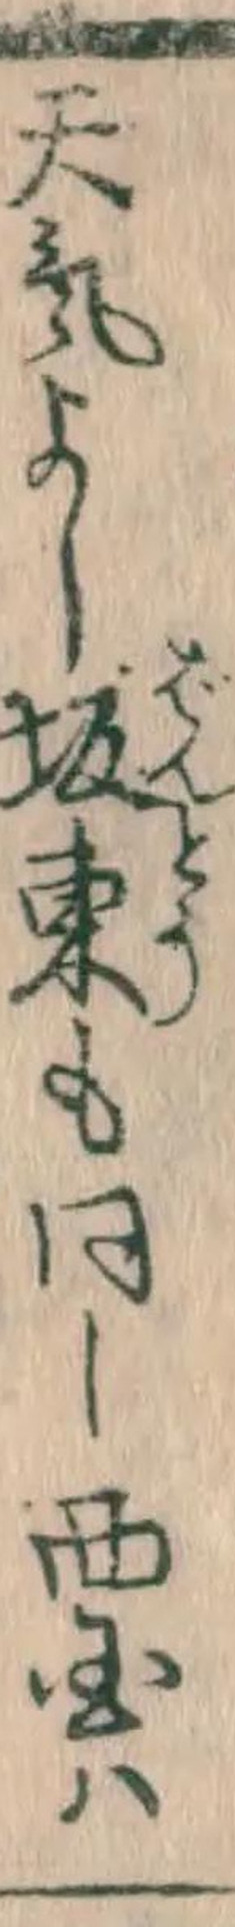天気よし坂東も同し西国は
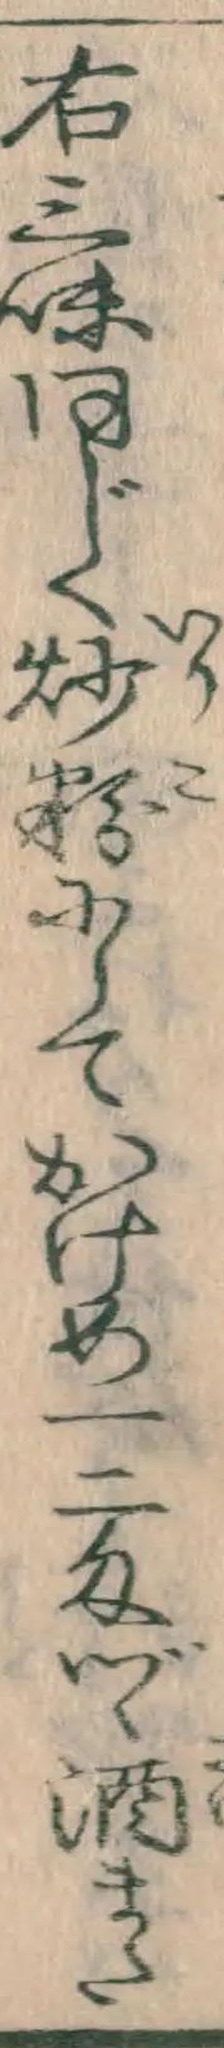右三味同じく炒粉にしてかけめ一二匁づゝ酒また
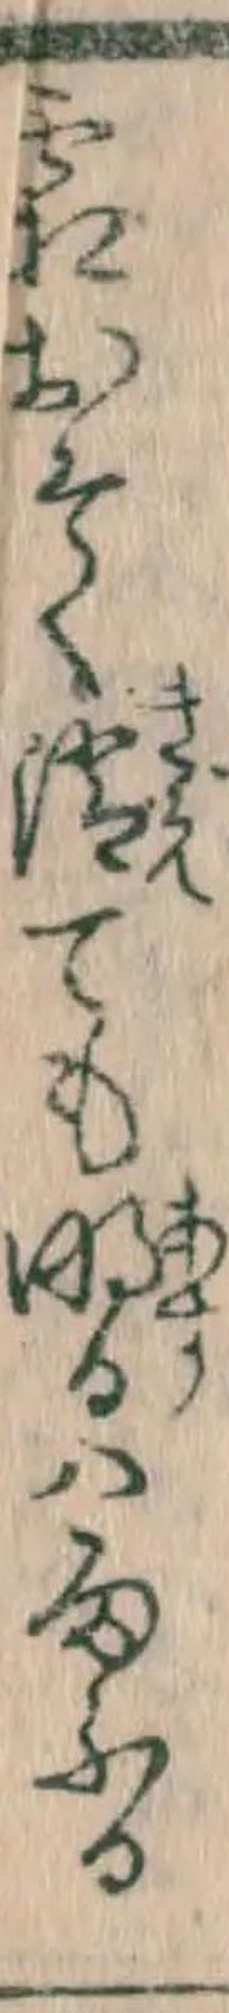霜おそく消ても明日は雨ふる
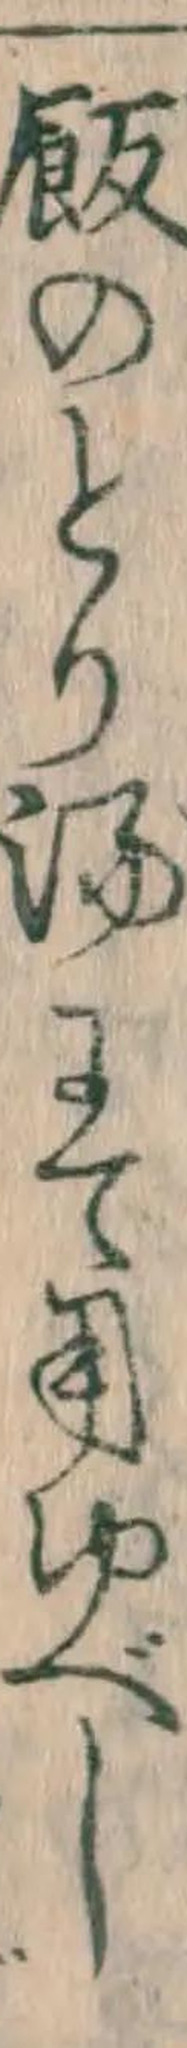飯のとり湯にて用ゆべし
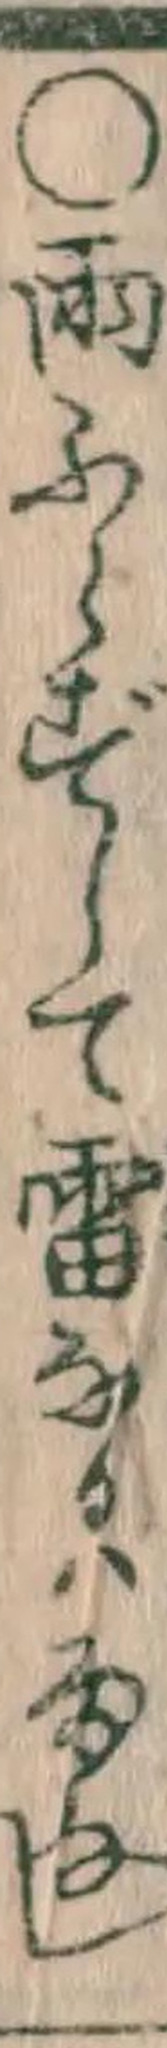○雨ふらずして雷なるは雨なし
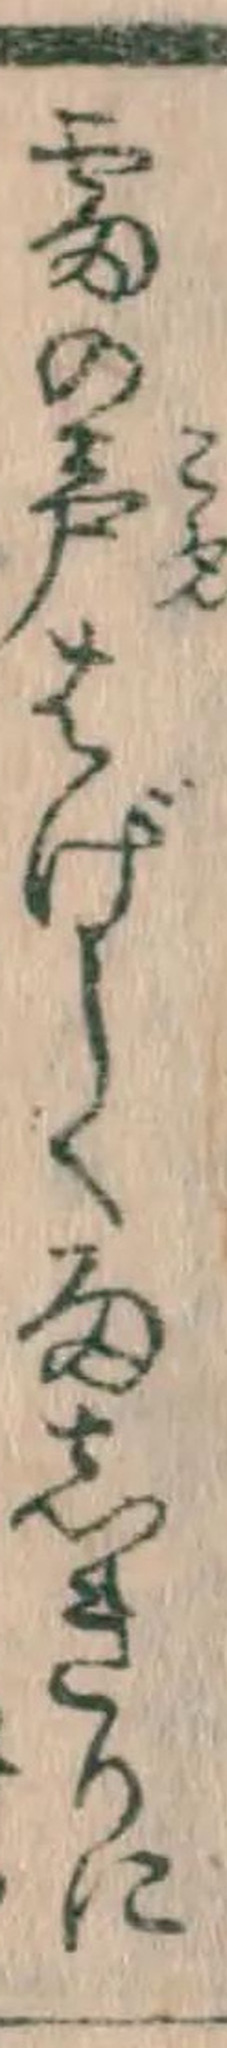雷の声はげしく雨しきりに
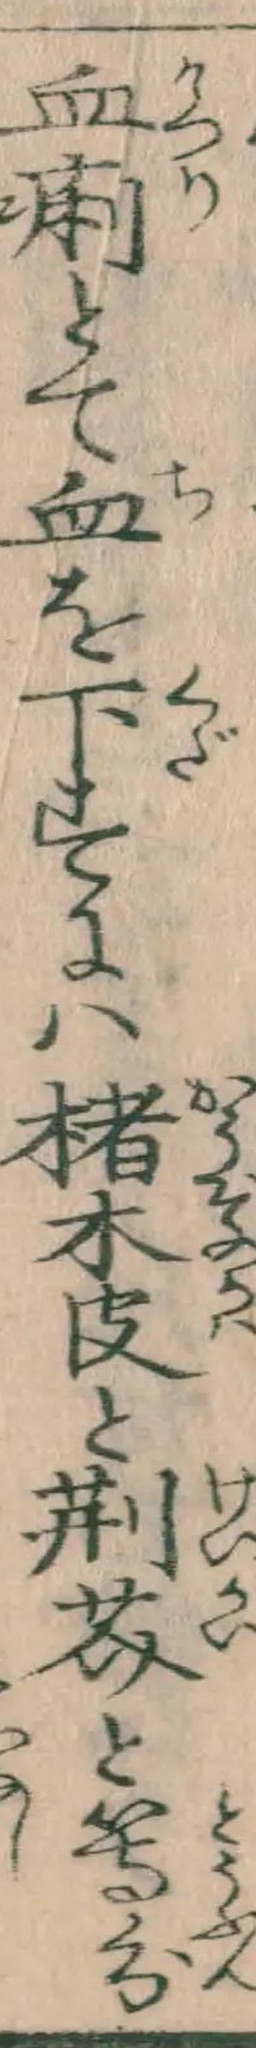血痢とて血を下すには楮木皮と荊芥と等分
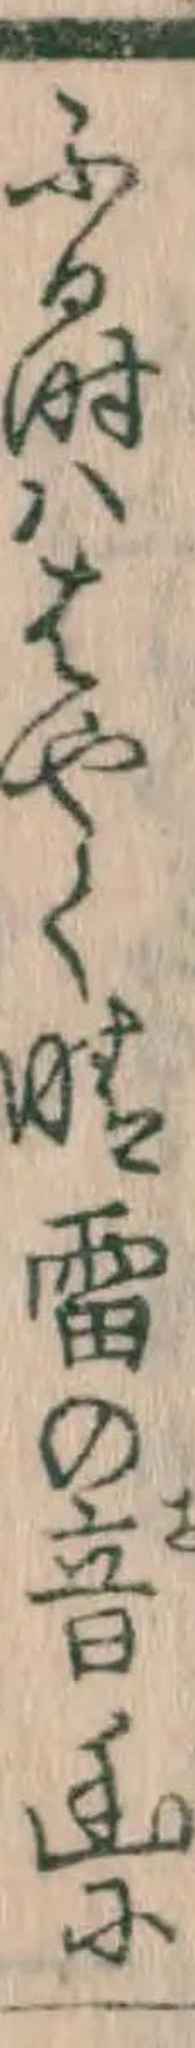ふる時ははやく晴雷の音幽に
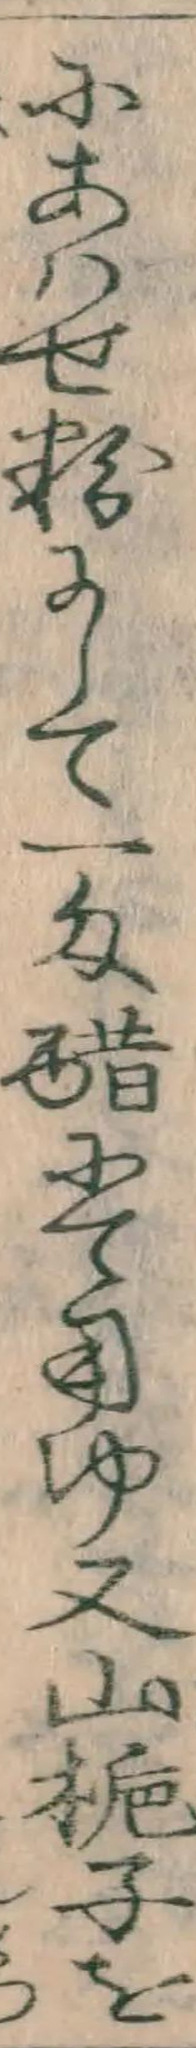にあはせ粉にして一匁醋にて用ゆ又山梔子を
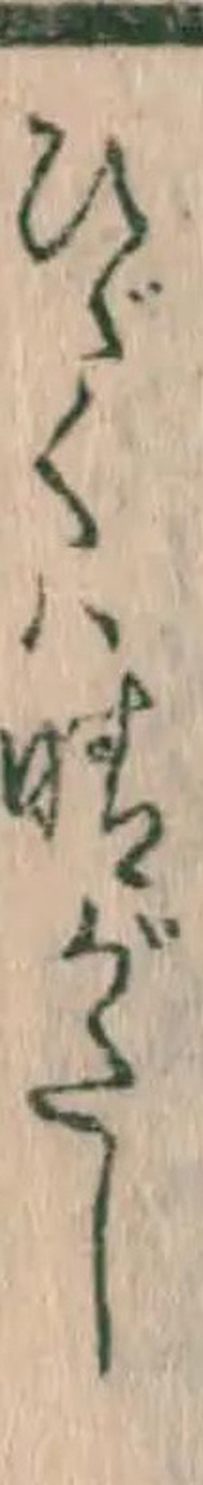ひゞくは晴がたし
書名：広益秘事大全 3巻. [4]
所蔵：国立国会図書館 National Diet Library, JAPAN
